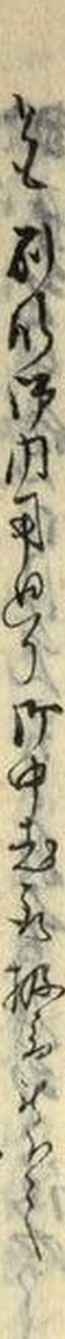とも別段御内用廻り御中老取扱ニ而被下之
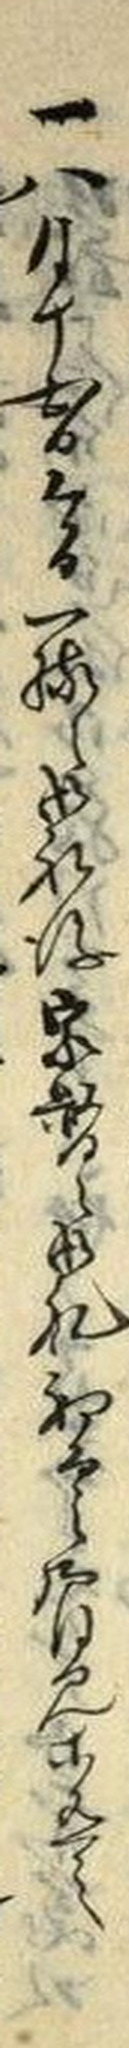一八月十五日今日一統之御礼後家督之御礼初而之御目見等有之
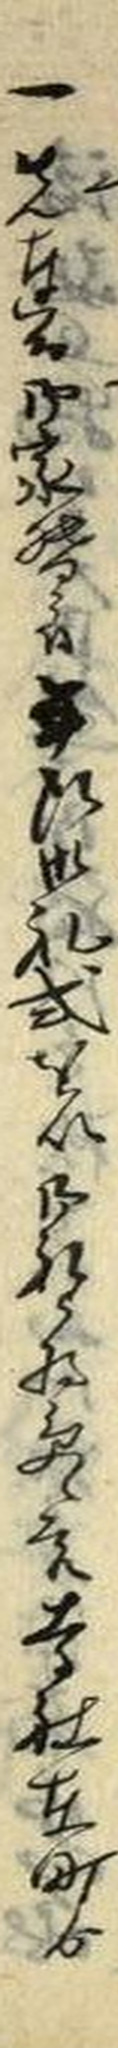一先達而御家督ニ付年頭御礼式を以御礼被為受候節寺社在町ゟ

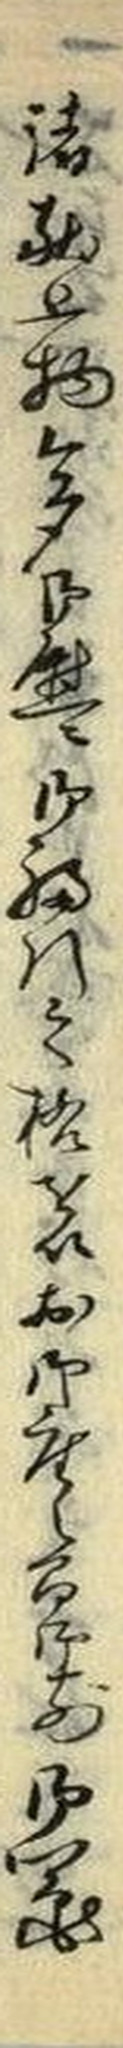諸献上物今夕御慰ニ御福引之格を以於御座之間御前御鬮
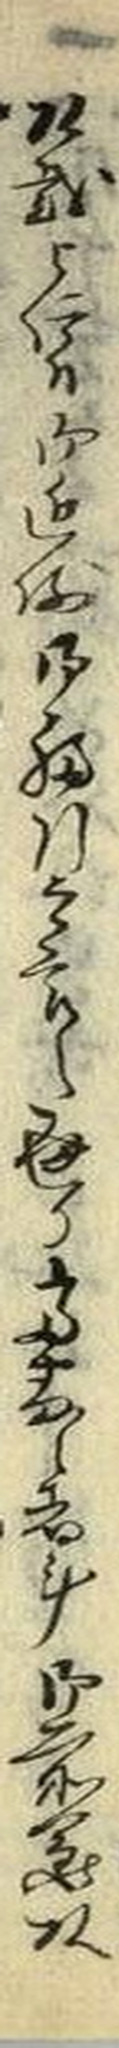頂戴被仰付御近例御福引之節之通り当番之者斗御前鬮頂
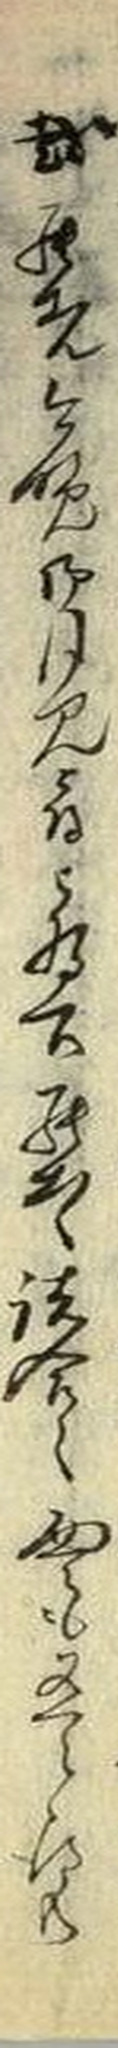戴罷出ル今晩御月見ニ付被為召罷出候詰合之面々も有之候得共
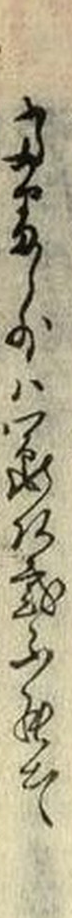当番之外ハ鬮頂戴不罷出候
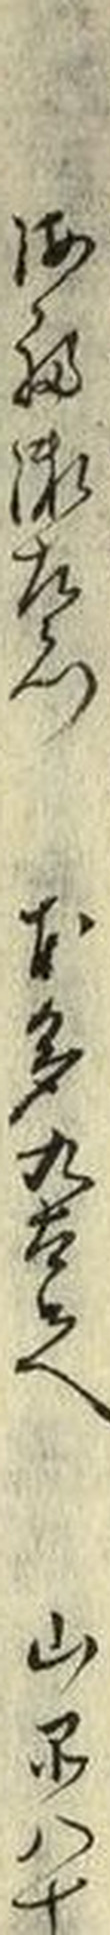海福瀬左衛門本多九太夫山品八十郎
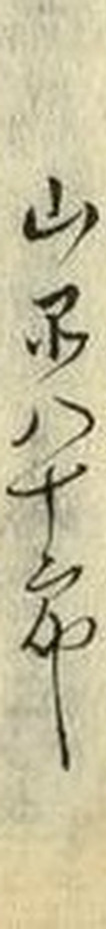山品八十郎
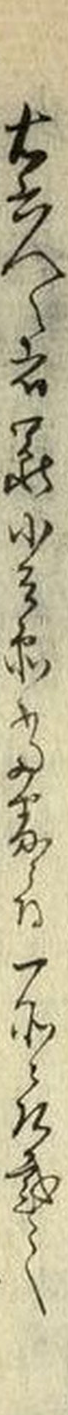右六人之者鬮小兵衛当番ニ付一所ニ頂戴之
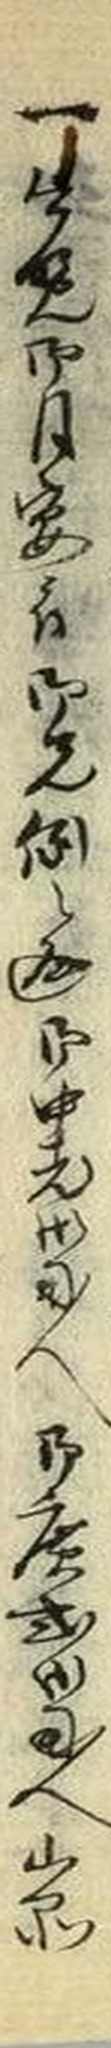一今晩御月宴ニ付御先例之通御中老御用人御広式御用人山品
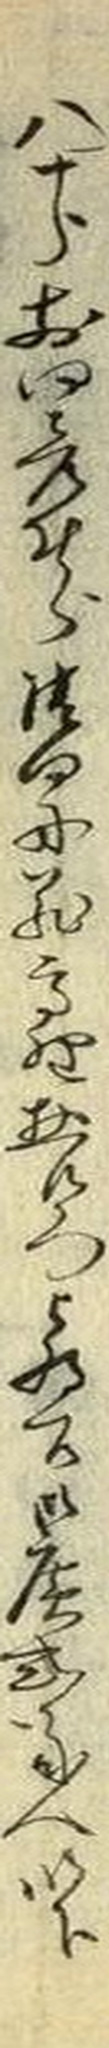八十郎前田彦次郎清田丹蔵高野惣左衛門被為召御広式御用人以下
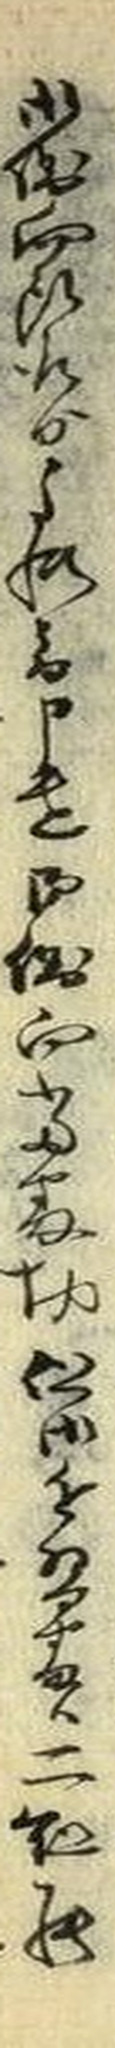御側向頭取ゟ手紙ニ而申遣御側向当番切但御近習番ハ二組罷
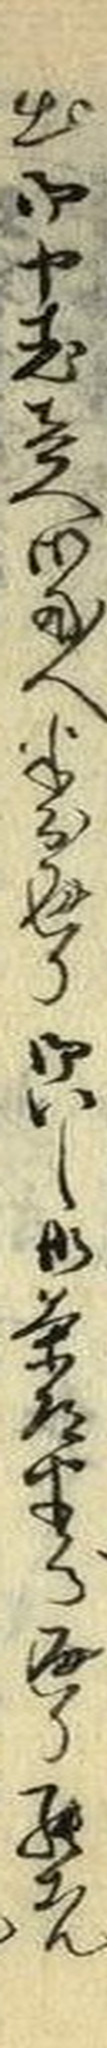出御中老壱人御用人半分通り御いし御茶道半分通り罷出ル
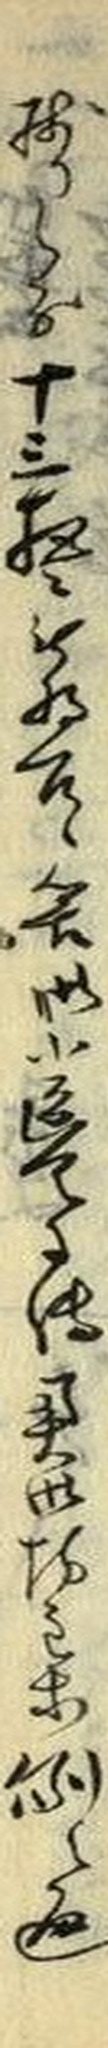残り之分十三夜ニ被為召候筈御小道具手伝奥御坊主等例之通
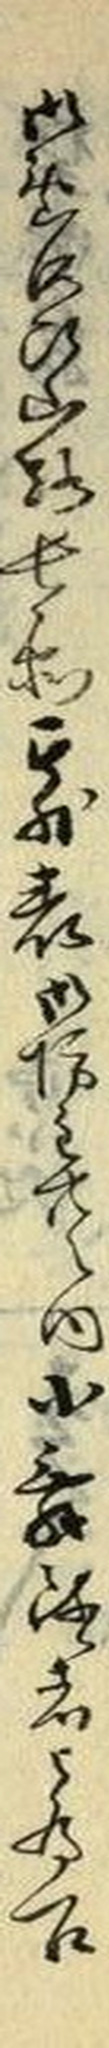御台所頭山路長兵衛其外表御坊主共之内小舞致候者被為召
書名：少傅日録抄（斉承付側向頭取日記、在国）
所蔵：福井県文書館 Fukui Prefectural Archives
